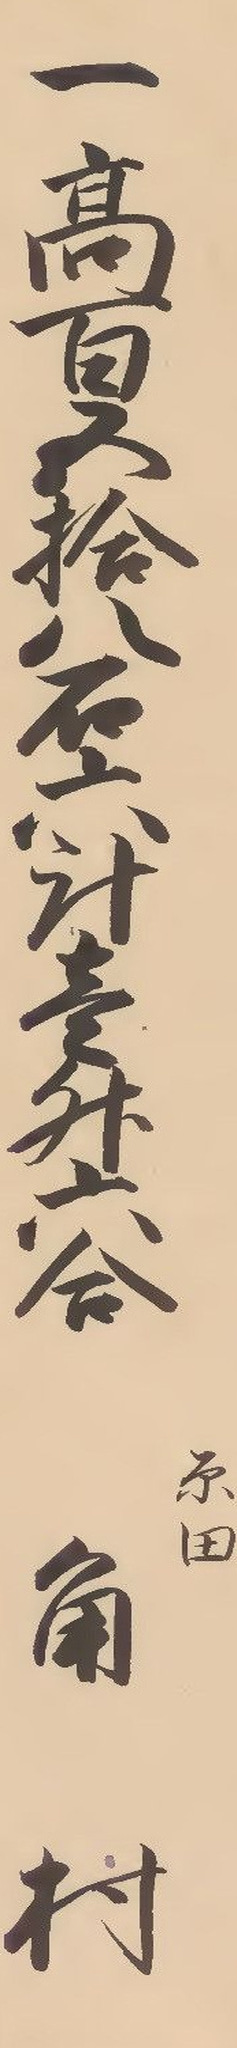一高百五拾八石六斗壱升六合角村

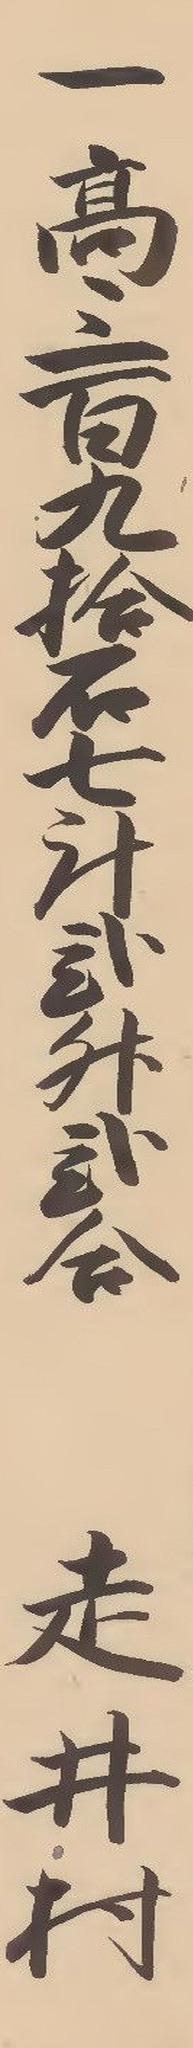一高三百九拾石七斗弐升弐合走井村
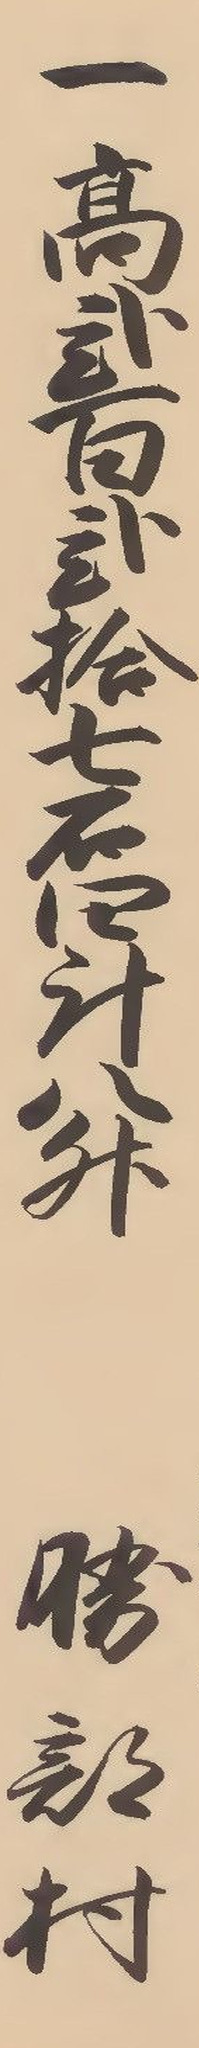一高弐百弐拾七石四斗八升勝部村
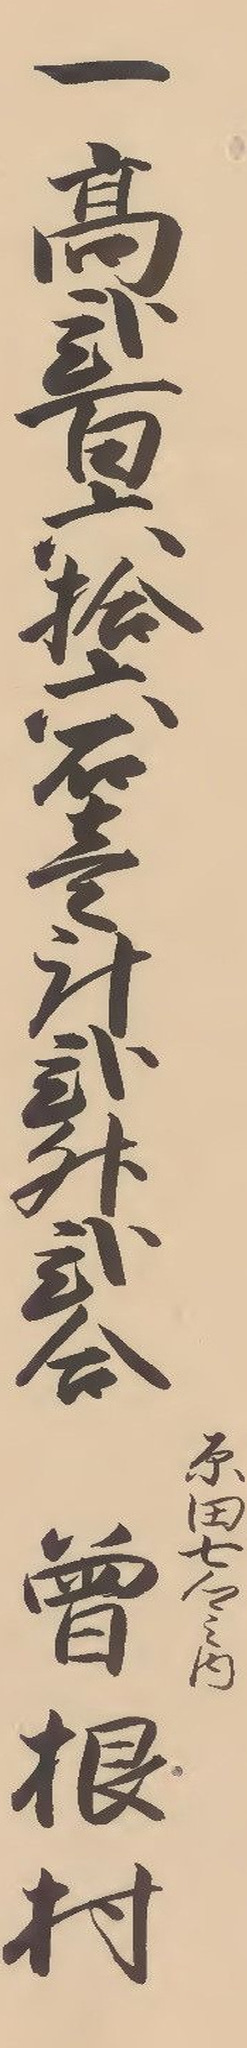一高弐百六拾六石壱斗弐升弐合曽根村
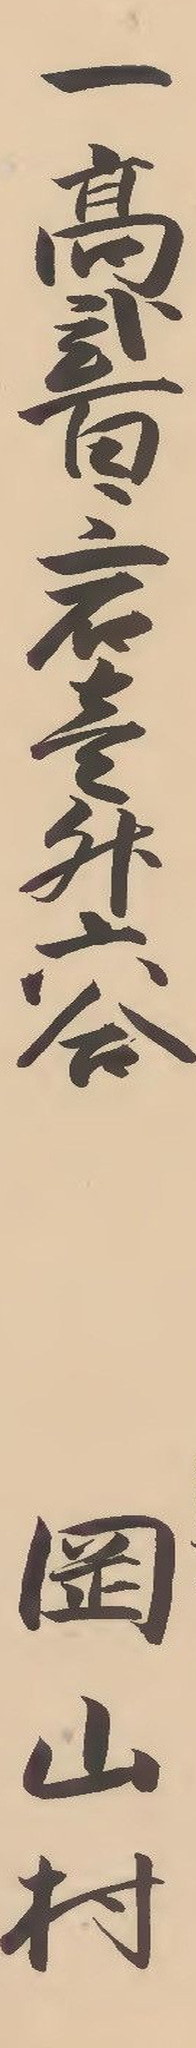一高弐百三石壱升六合岡山村
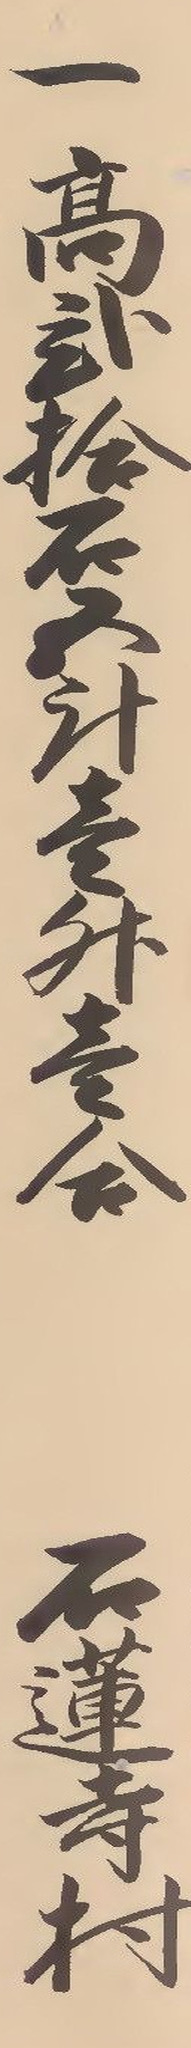一高弐拾石五斗壱升壱合石蓮寺村
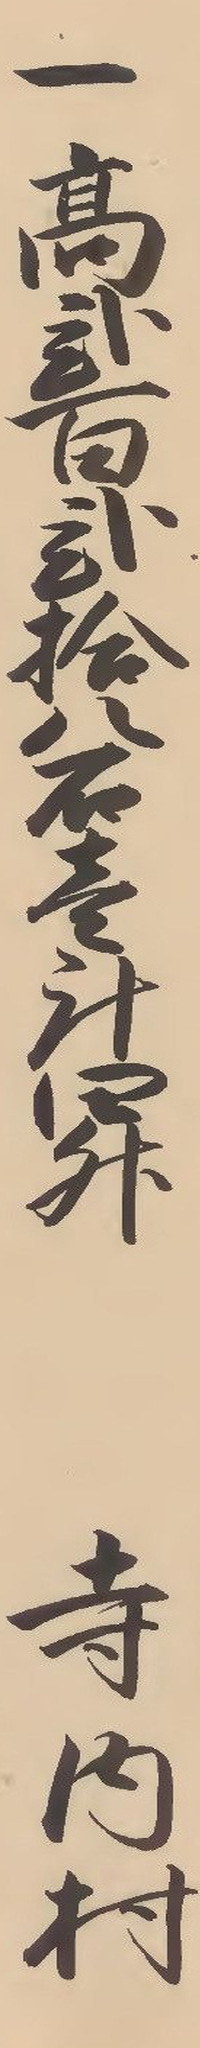一高弐百弐拾八石壱斗四升寺内村
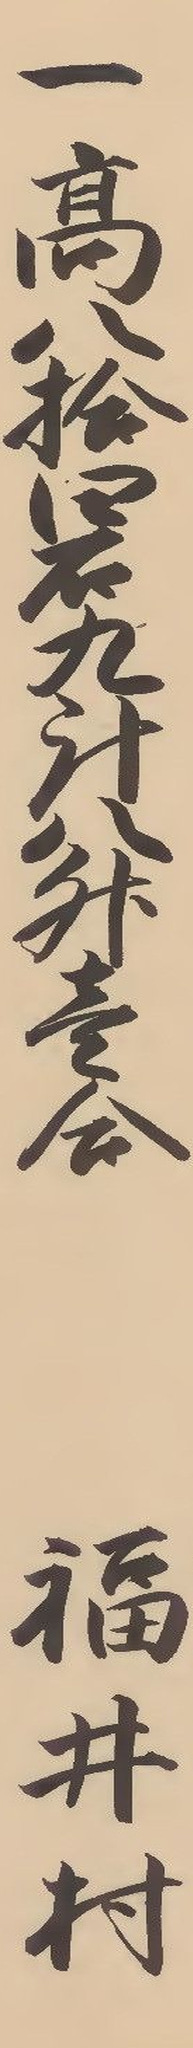一高八拾四石九斗八升壱合福井村
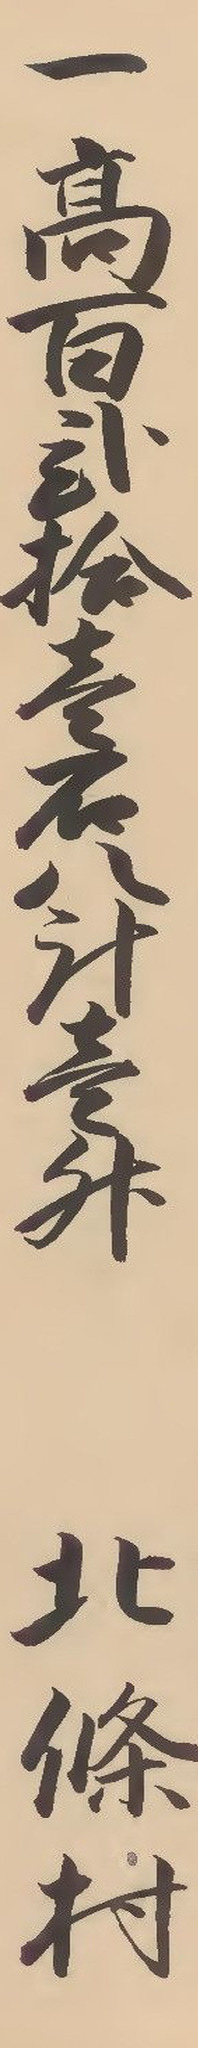一高百弐拾壱石八斗壱升北条村

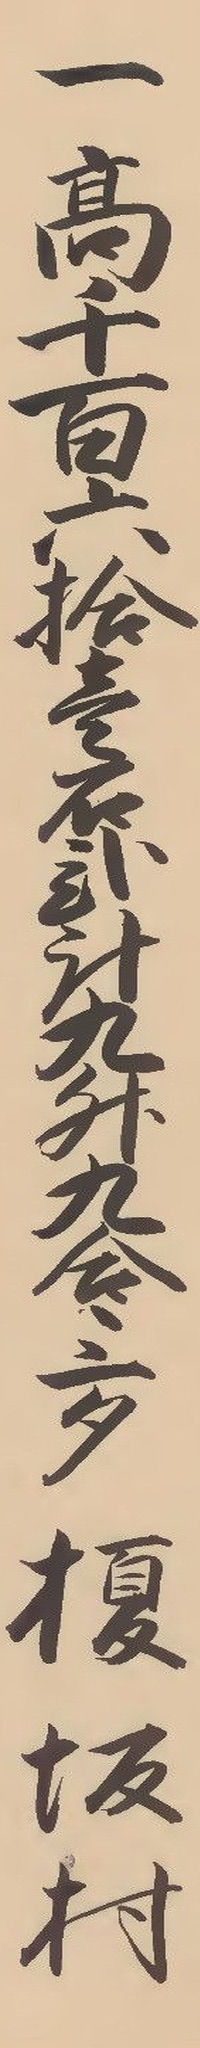一高千百六拾壱石弐斗九升九合三勺榎坂村
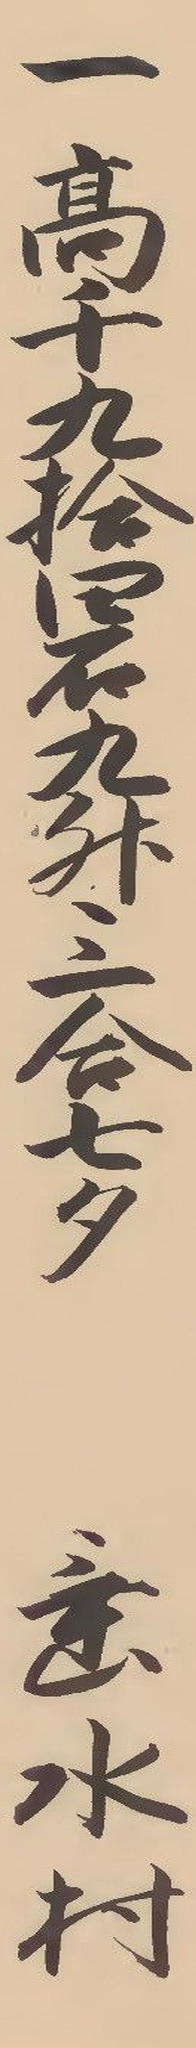一高千九拾四石九升三合七勺垂水村
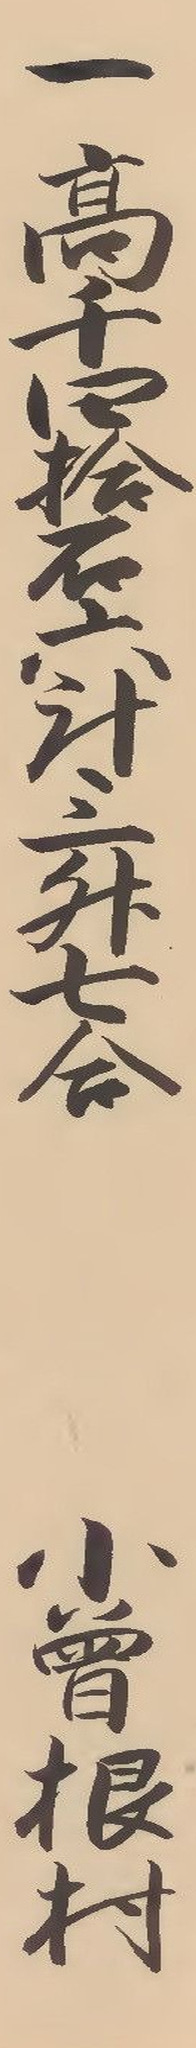一高千四拾石六斗三升七合小曽根村
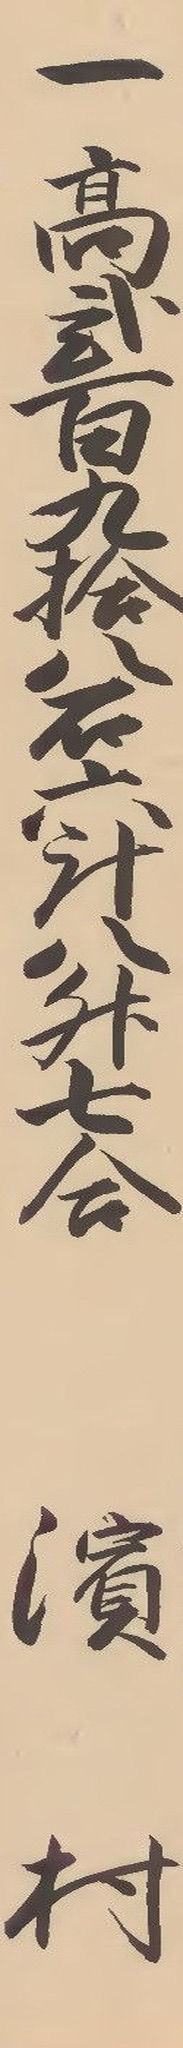一高弐百九拾八石六斗八升七合浜村
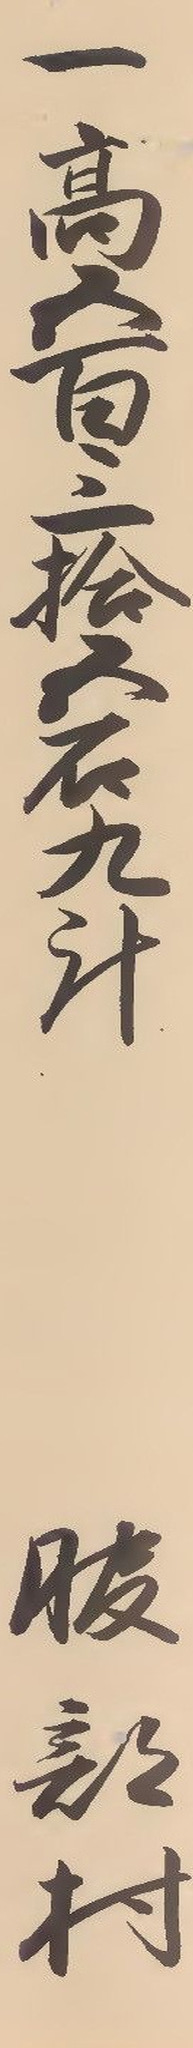一高五百三拾五石九斗服部村
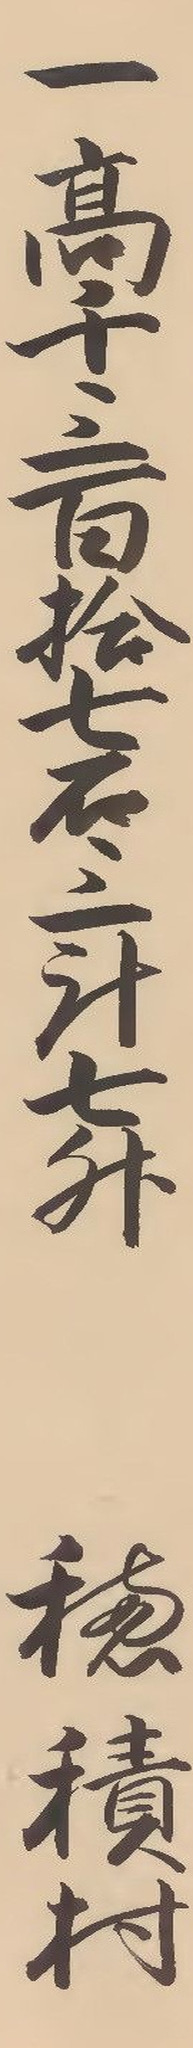一高千三百拾七石三斗七升穂積村
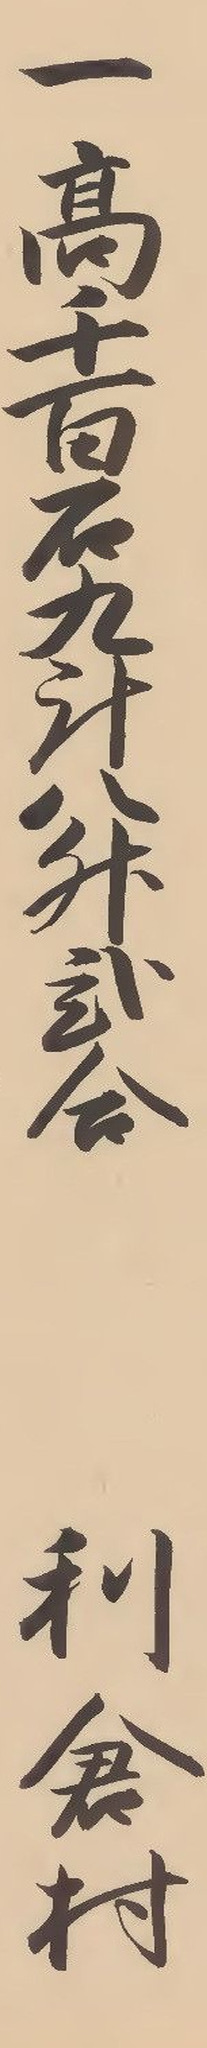一高千百石九斗八升弐合利倉村
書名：摂津国郷帳
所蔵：国立公文書館 National Archives of Japan
